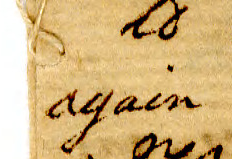again
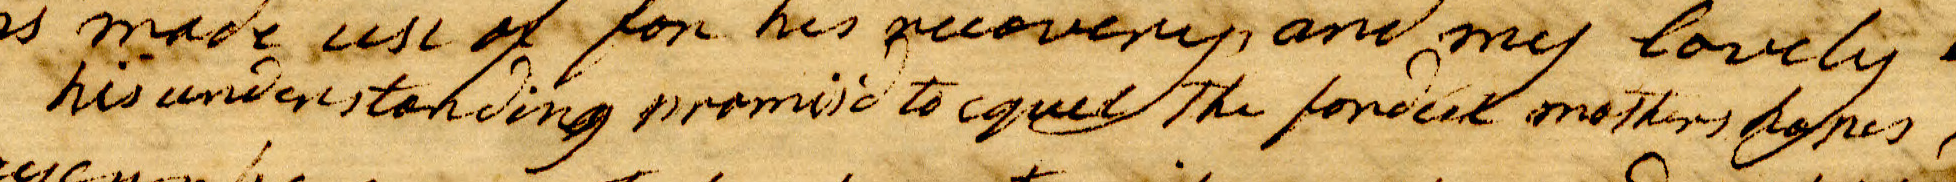his understanding promis'd to equal the fondest mothers hopes
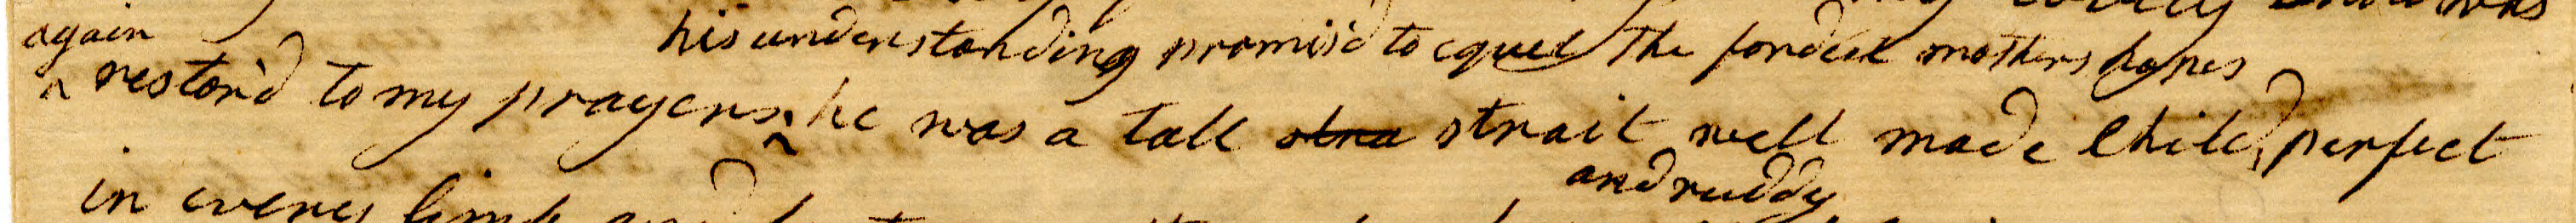^ restor'd to my prayers ^ he was a tall [stra] strait well made Child, perfect
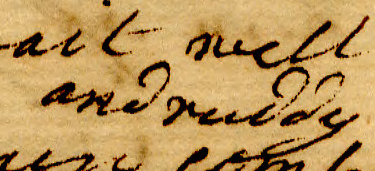and ruddy
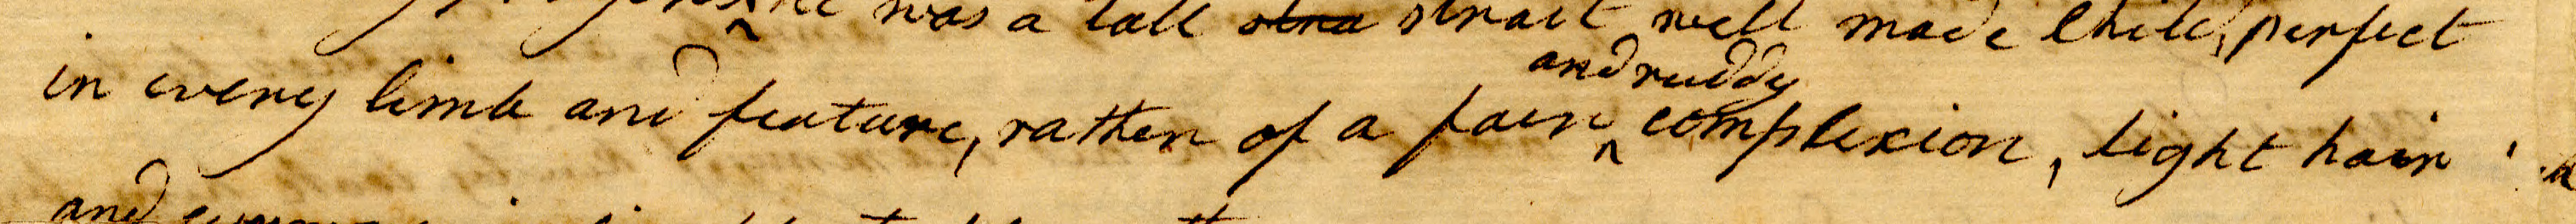in every limb and feature, rather of a fair ^ complexion, light hair
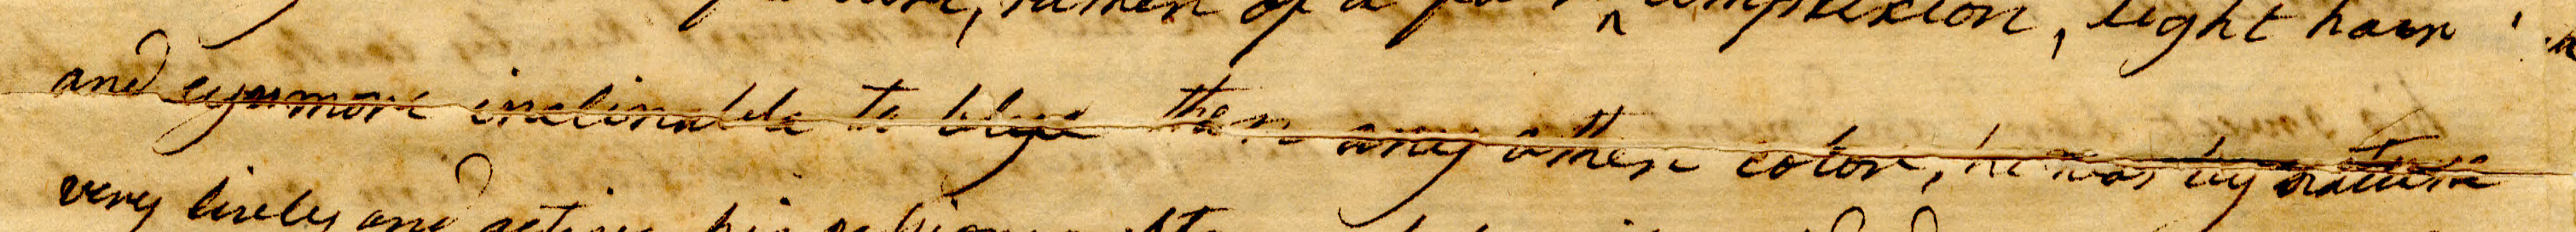and eyes more inclinable to blue than any other color, he was by nature
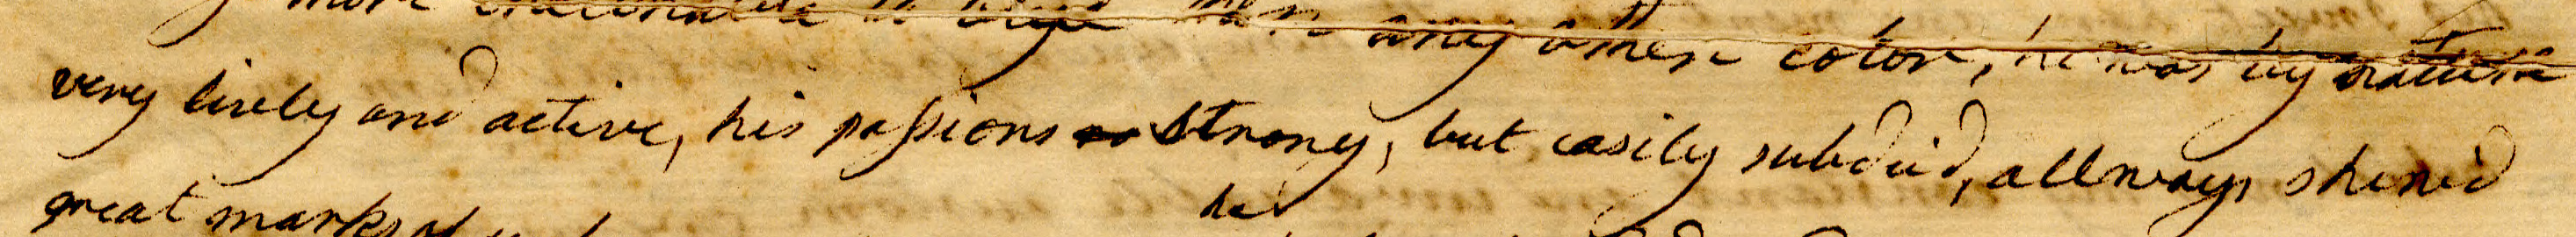very lively and active, his passions [__] Strong, but easily subdu'd, allways shew'd
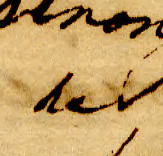he
